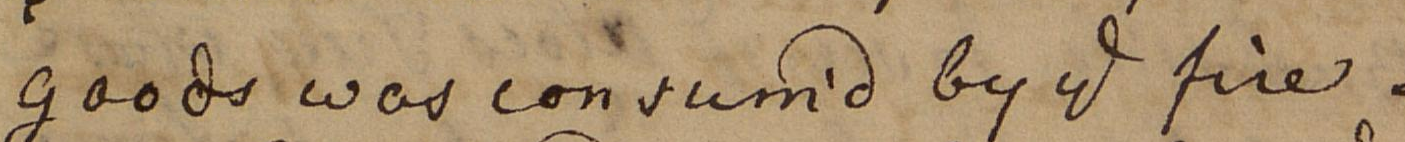goods was consum'd by y^e fire -
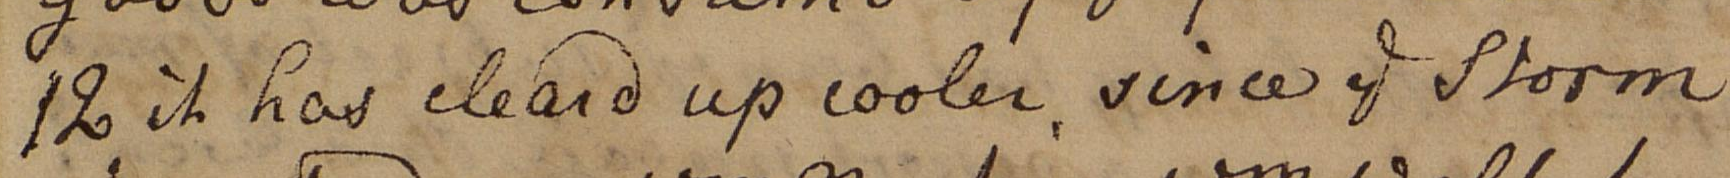12 it has cleard up cooler, since y^e storm
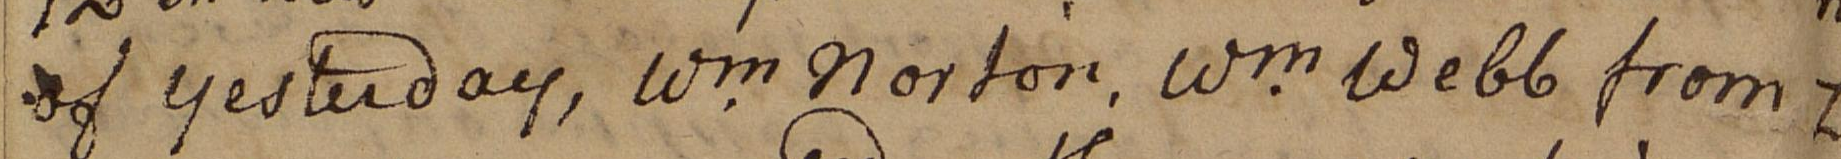of yesterday, W^m Norton, W^m Webb from
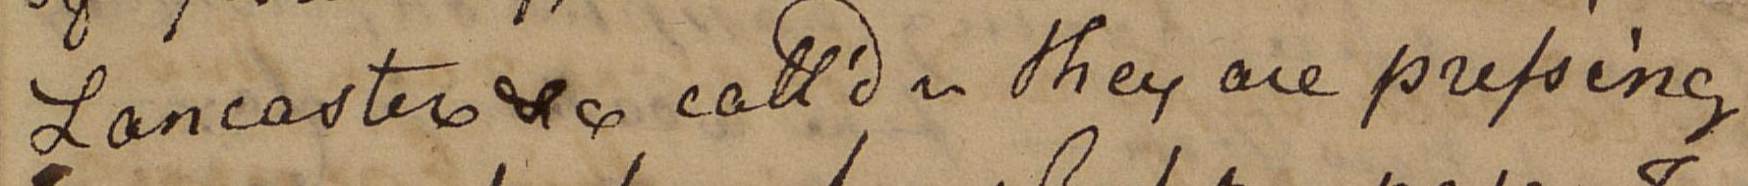Lancaster &c call'd- they are pressing
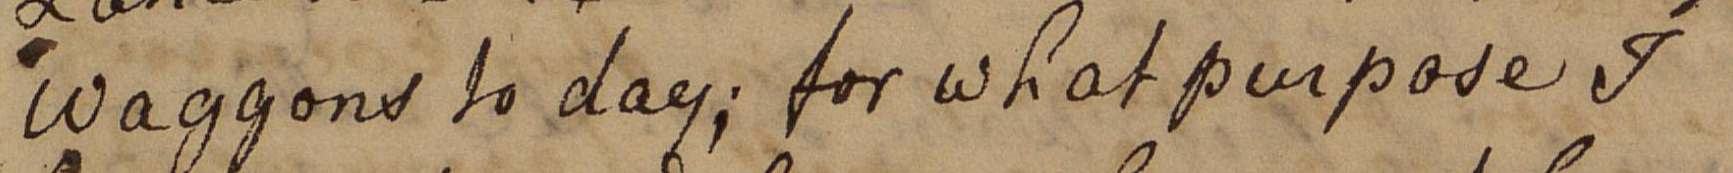Waggons to day; for what purpose I
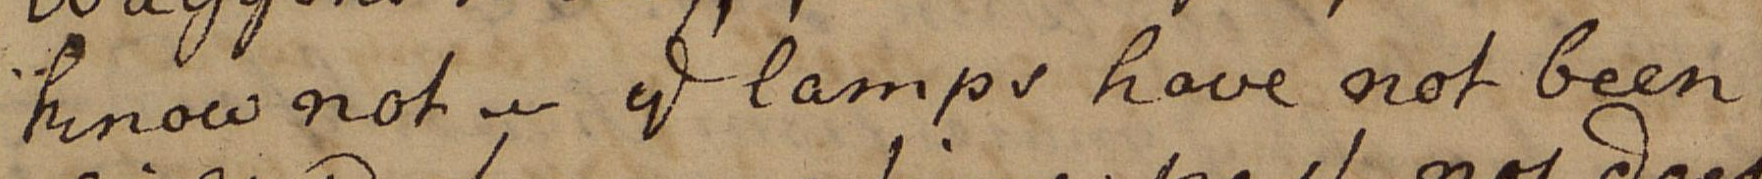know not- y^e Camps have not been
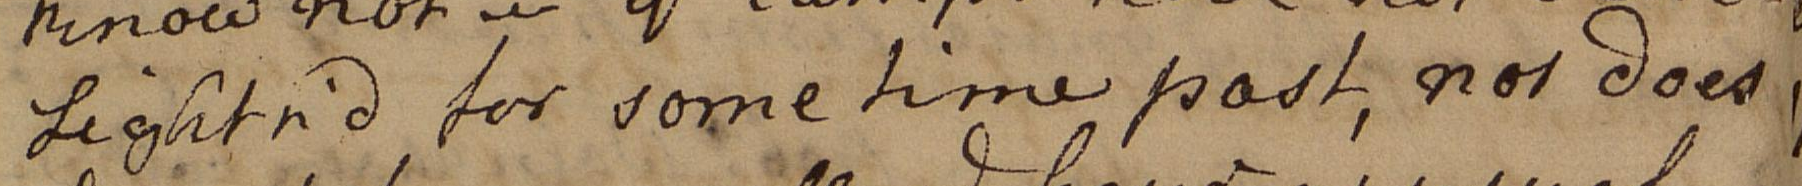Lightn'd for some time past, nor does
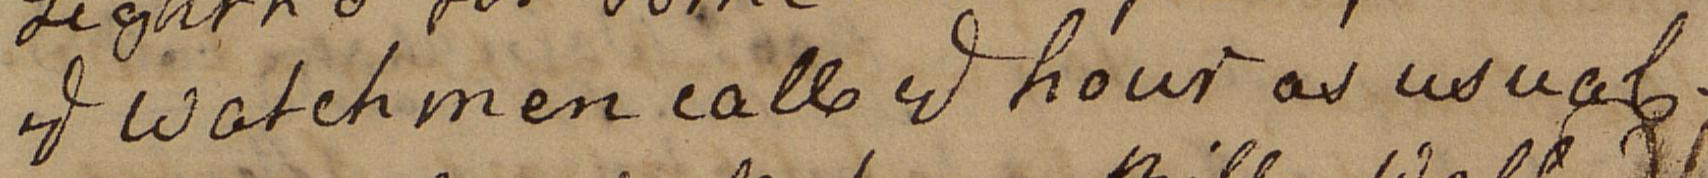y^e Watchmen call y^e hour as usual-
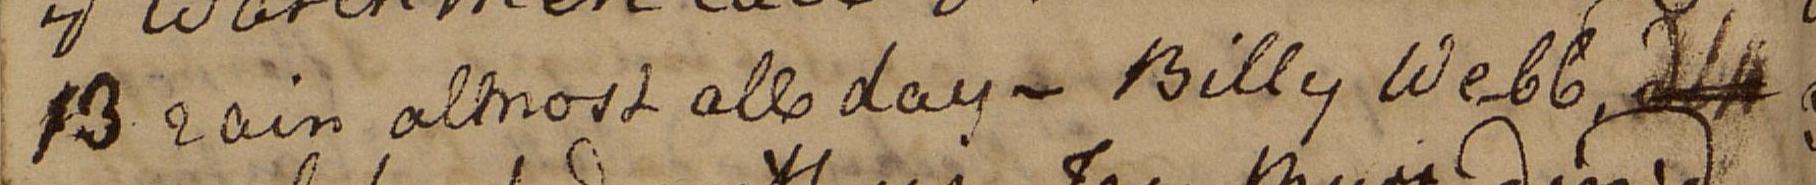13 rain almost all day- Billy Webb, [__]
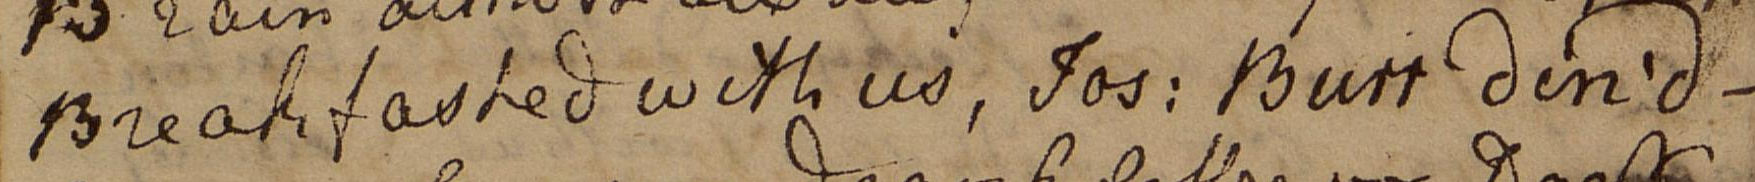Breakfasted with us, Jos: Burr din'd-
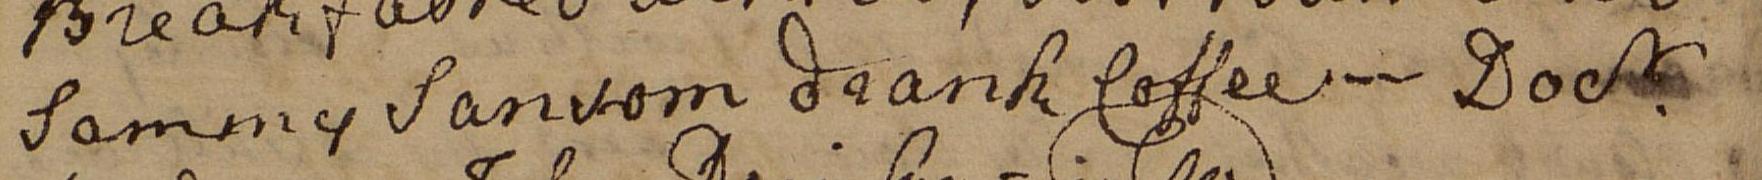Sammy Sansom drank Coffee- Doc.^r
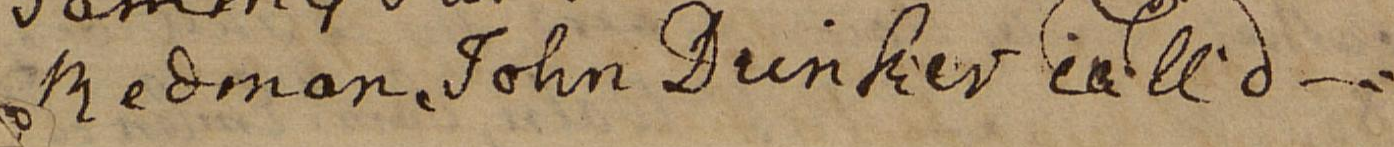Redman, John Drinker call'd-
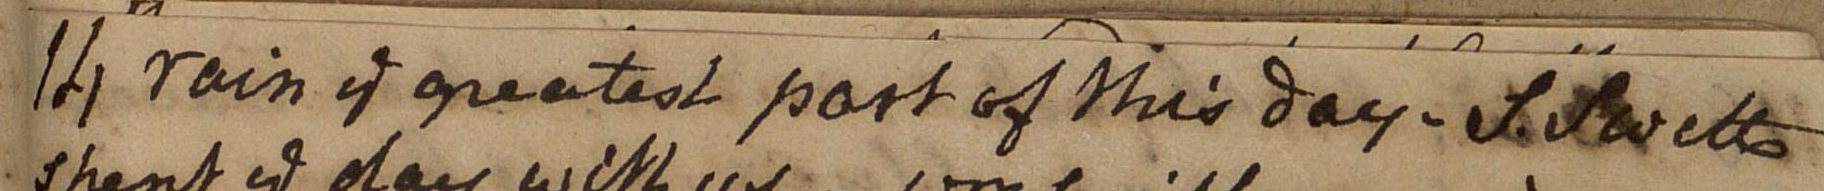14 rain y^e greatest past of this day- S Swett
